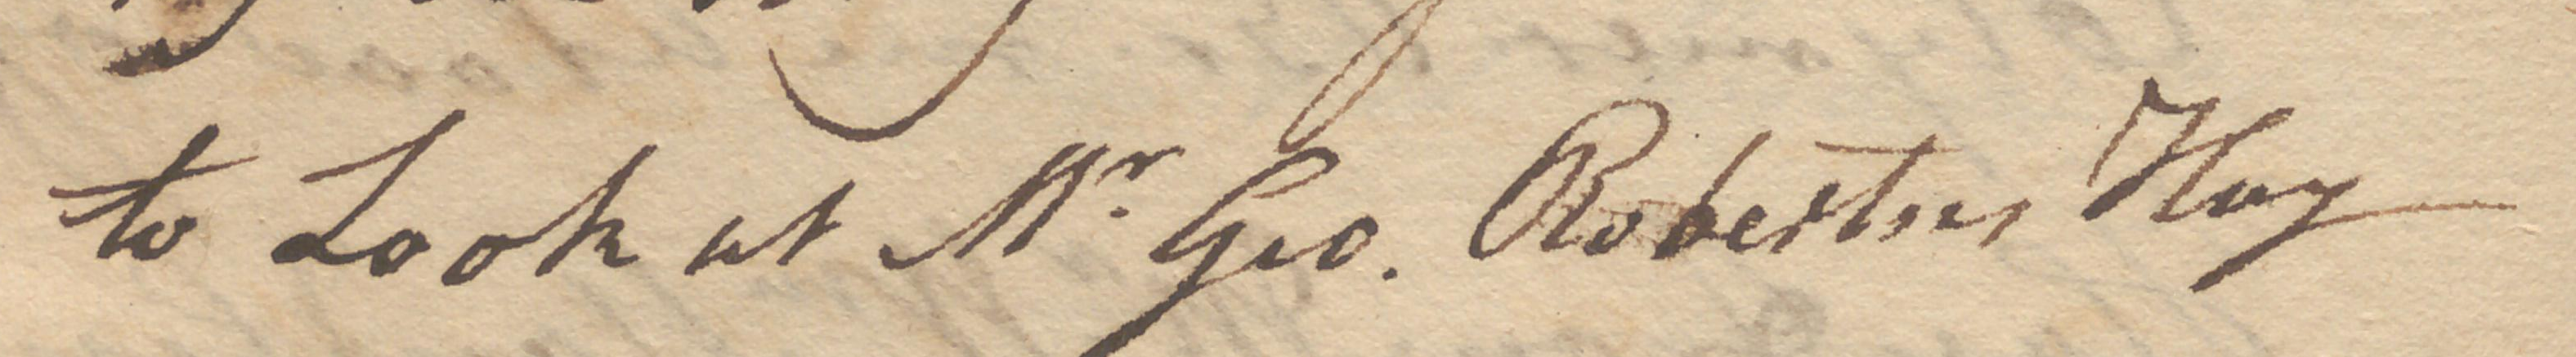to Look at M^r. Geo Robertses Hay
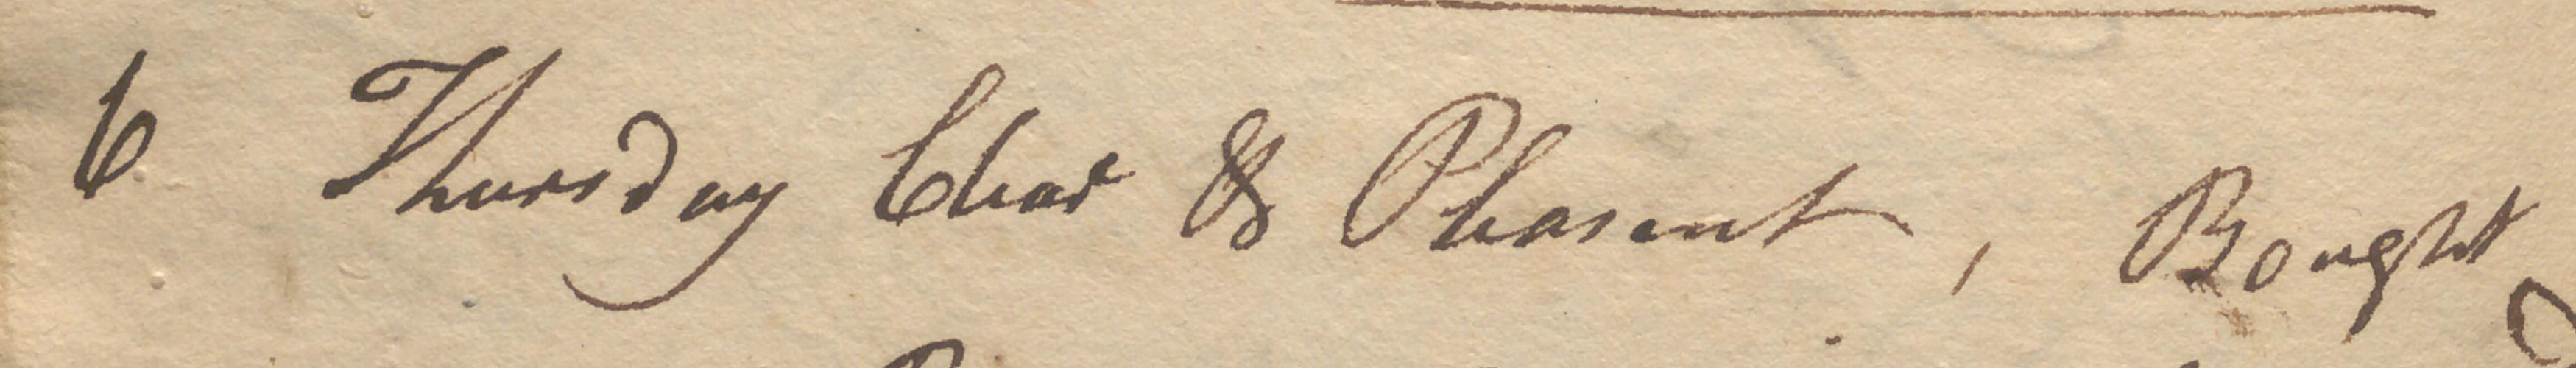6 Thursday Clear & Pleasent, Bought
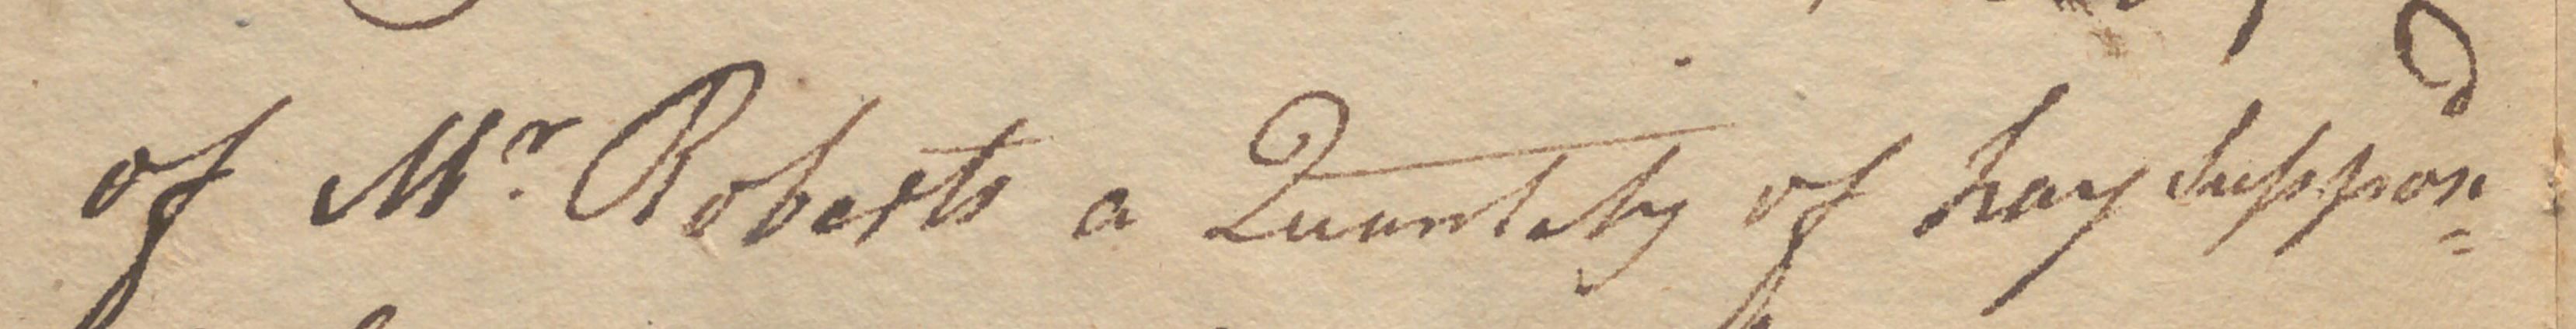of M^r. Roberts a Quantity of hay suppos^d
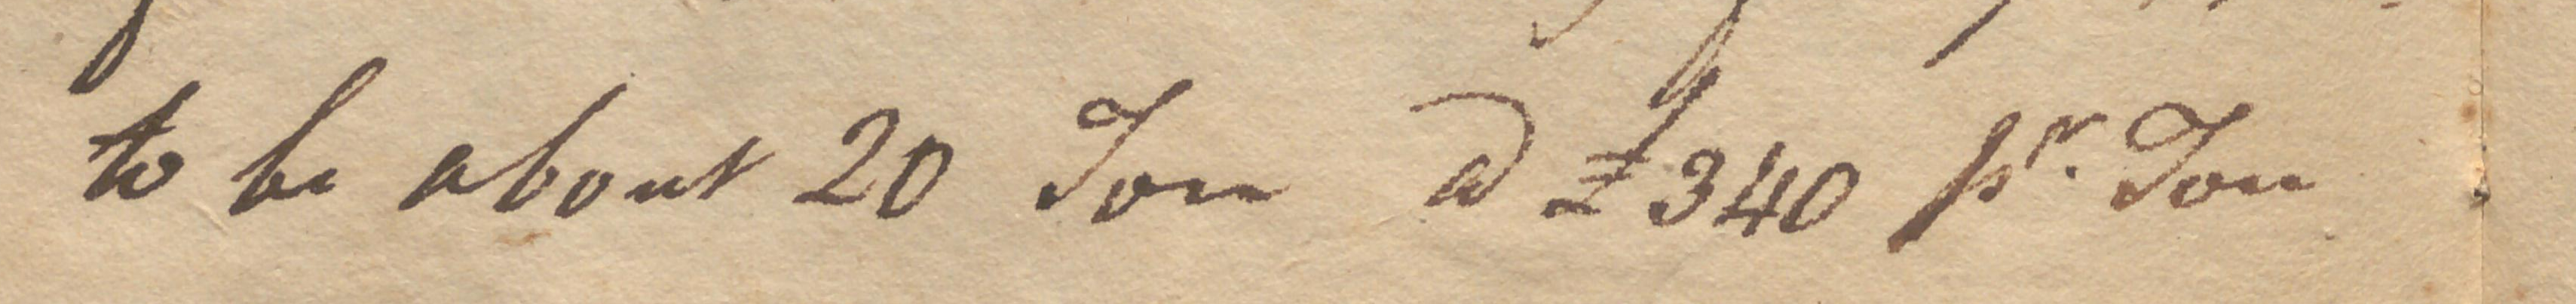to be about 20 Ton @ £340 p^r. Ton
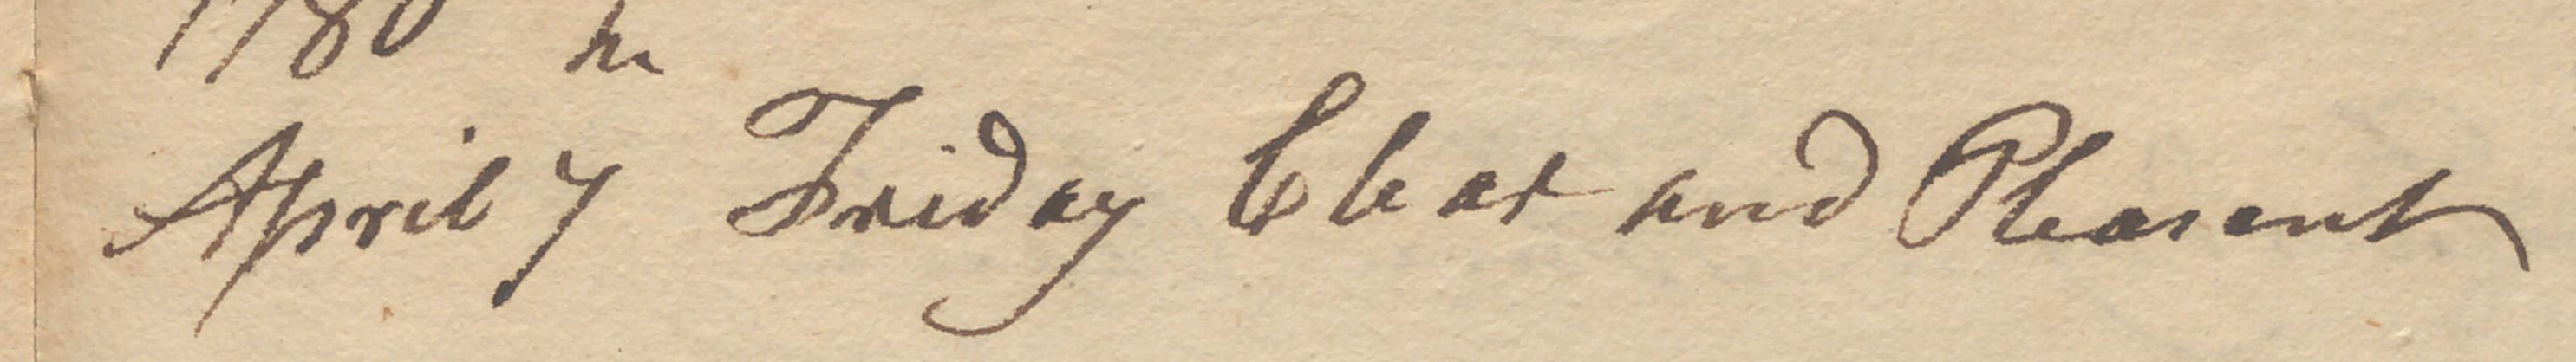April 7^th Friday Clear and Pleasent
